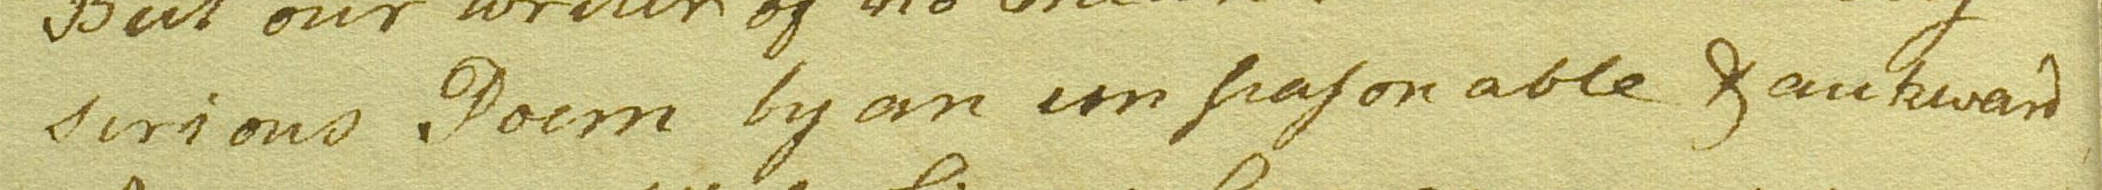serious Poem by an unreasonable & awkward
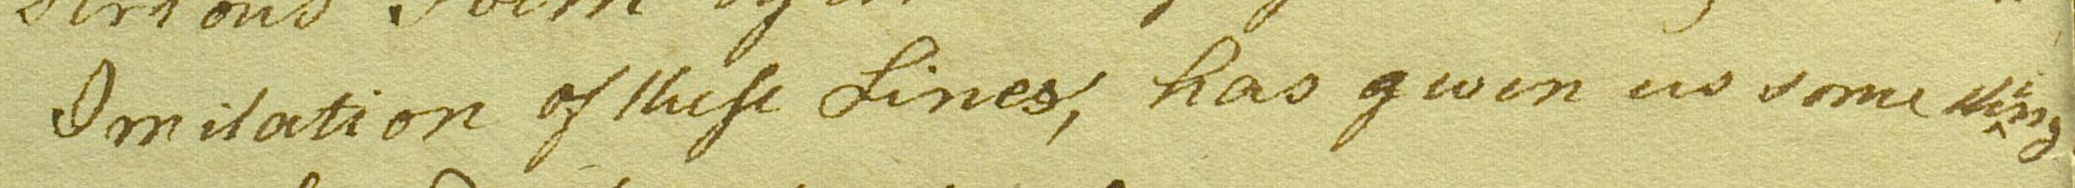Imitation of these Lines, has given us someth^ing
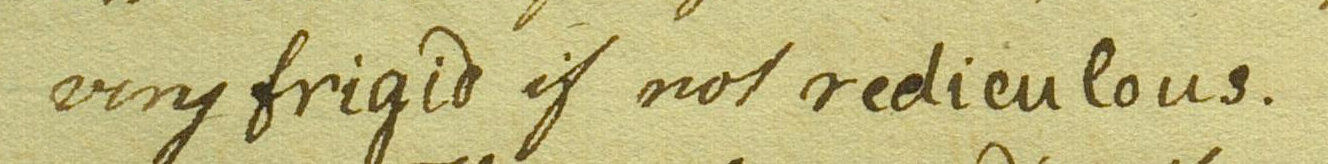very frigid if not rediculous.
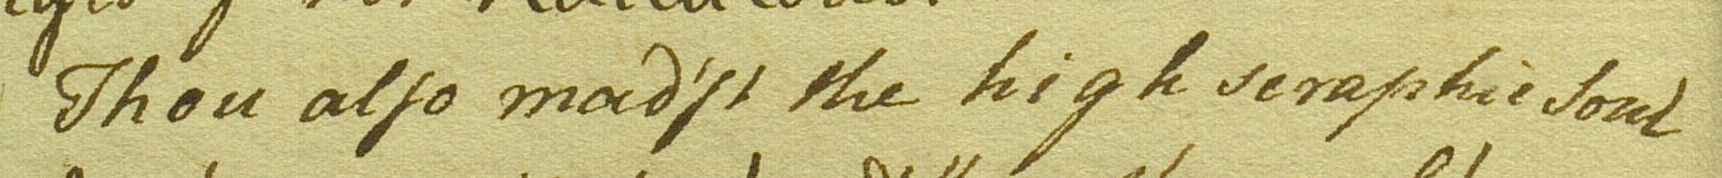Thou also mad'st the high seraphie Soul
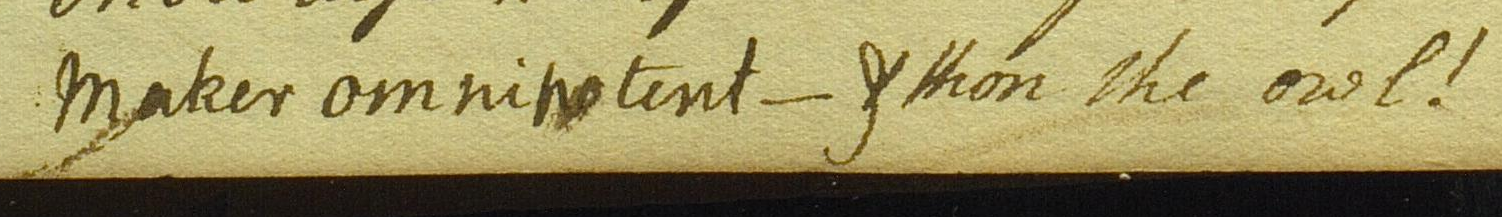maker omnipotent - & thou the owl!
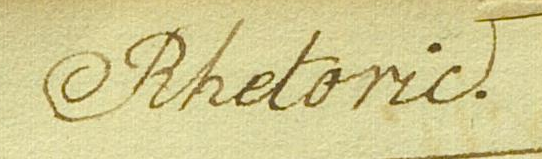Rhetoric.
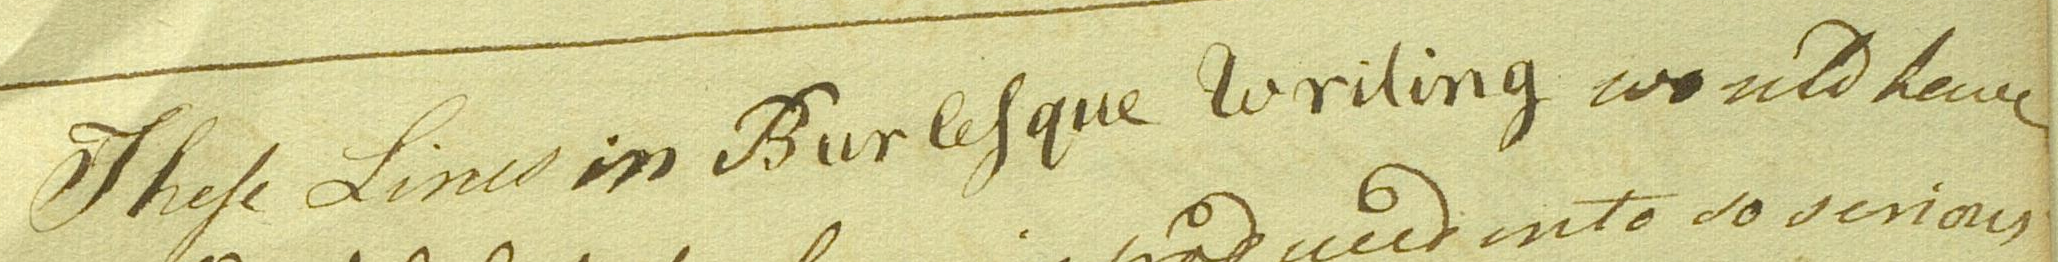These Lines in Burlesque Writing would have
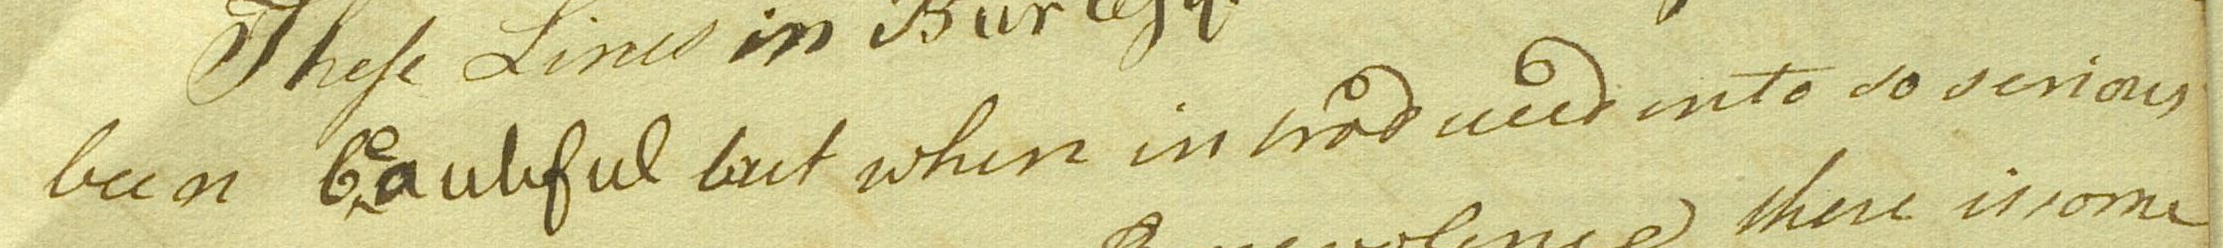been b^eautiful but when introduced so serious
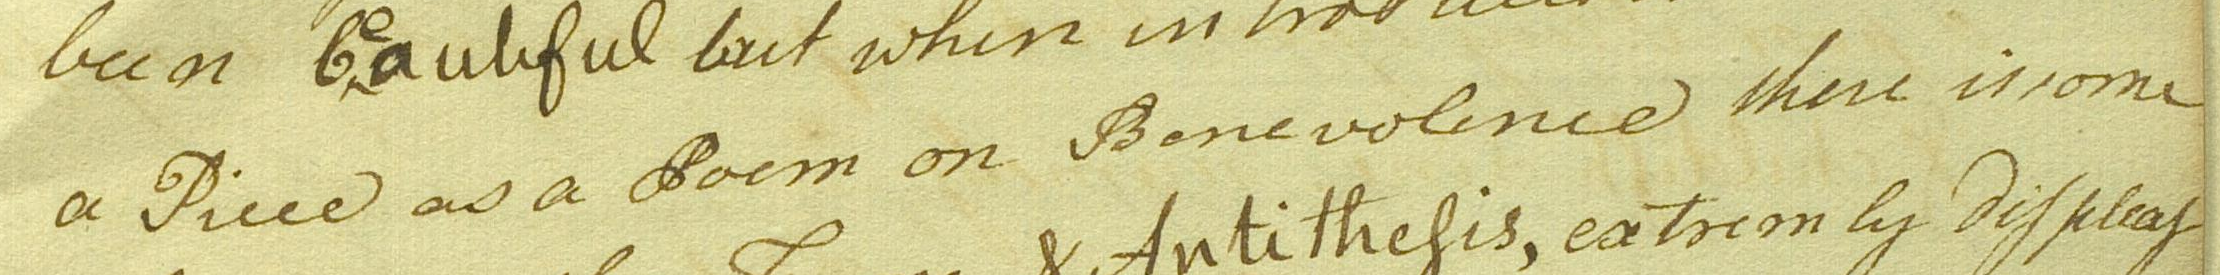a Piece as a Poem on Benevolence there is some
